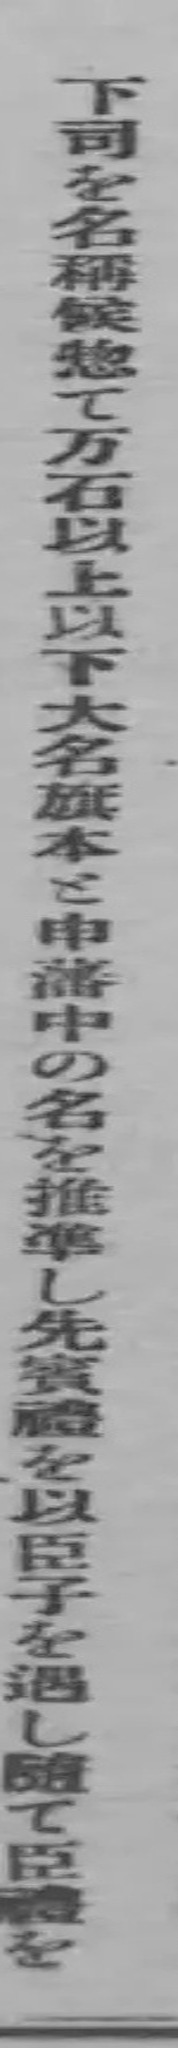下司を名称候惣て万石以上以下大名旗本と申藩中の名を推準し先賓礼を以臣子を遇し随て臣礼を
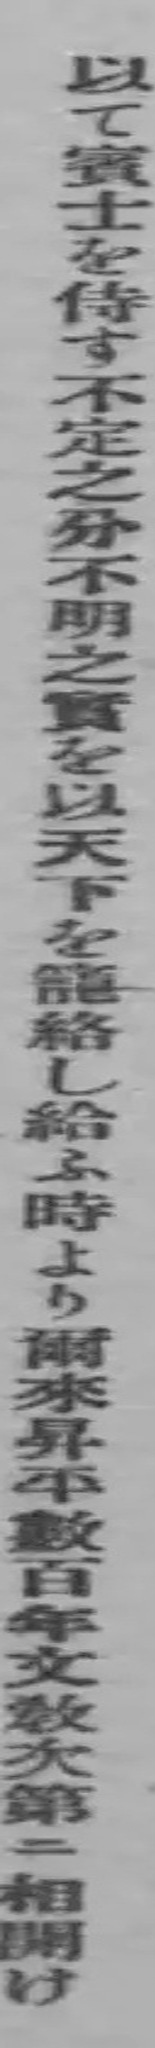以て賓士を侍す不定之分不明之実を以天下を籠絡し給ふ時より爾来昇平数百年文教次第ニ相開け
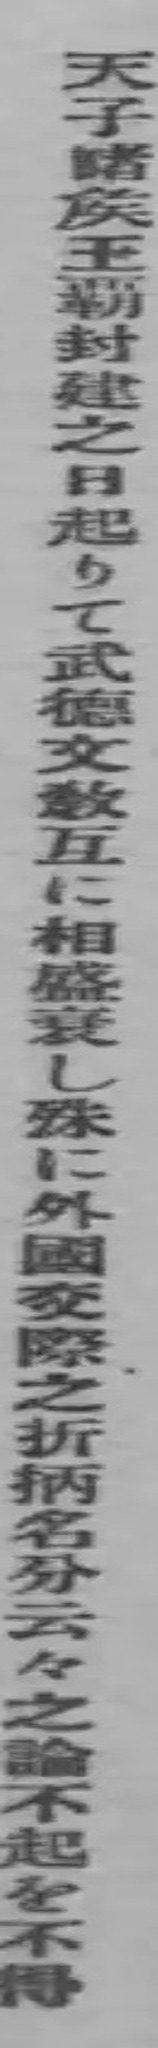天子諸侯王覇封建之日起りて武徳文教互に相盛衰し殊に外国交際之折柄名分云々之論不起を不得
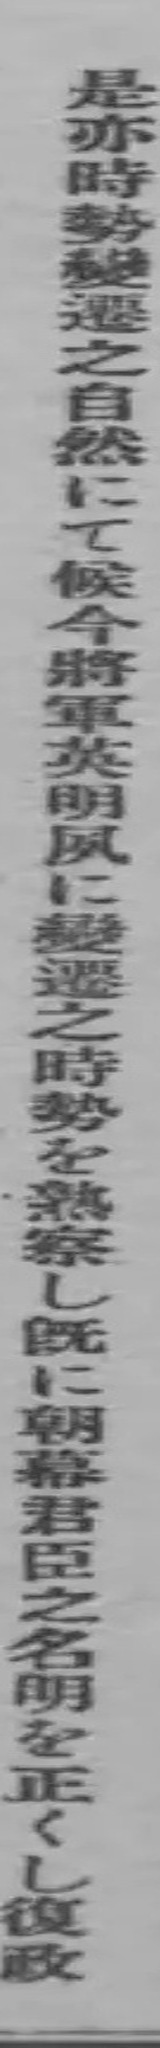是亦時勢変遷之自然にて候今将軍英明夙に変遷之時勢を熟察し既に朝幕之名明を正くし復政
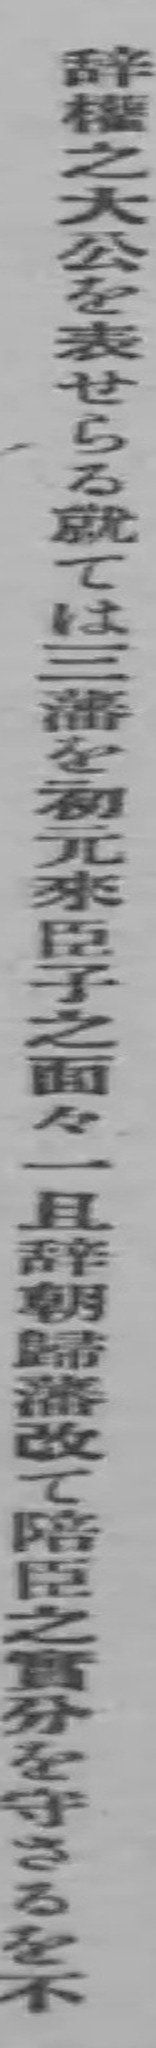辞権之大公を表せらる就ては三藩を初元来臣子之面々一且辞朝帰藩改て陪臣之実分を守さるを不
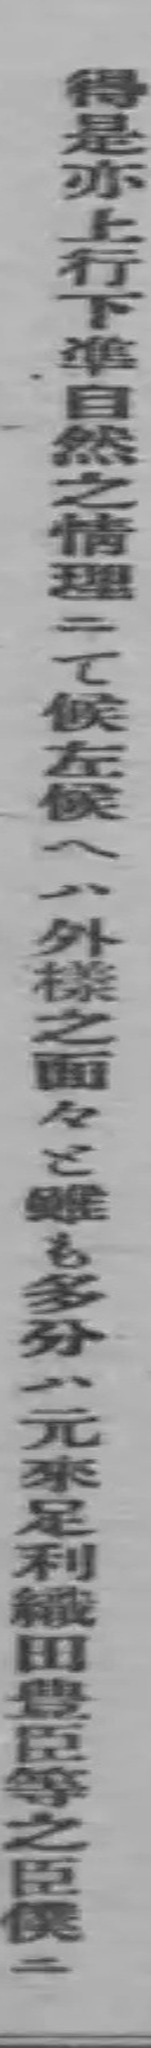得是亦上行下準自然之情理ニて候左候ヘハ外様之面々と雖も多分ハ元来足利織田豊臣等之臣僕ニ
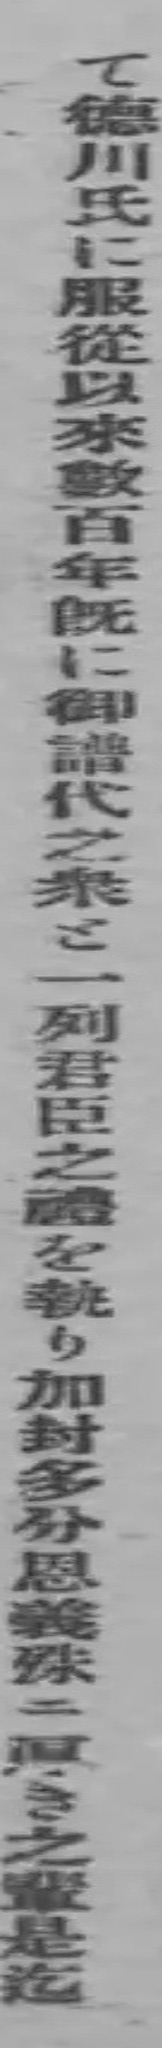て徳川氏に服従以来数百年既に御譜代之衆と一列君臣之礼を執り加封多分恩義殊ニ厚き之輩是迄
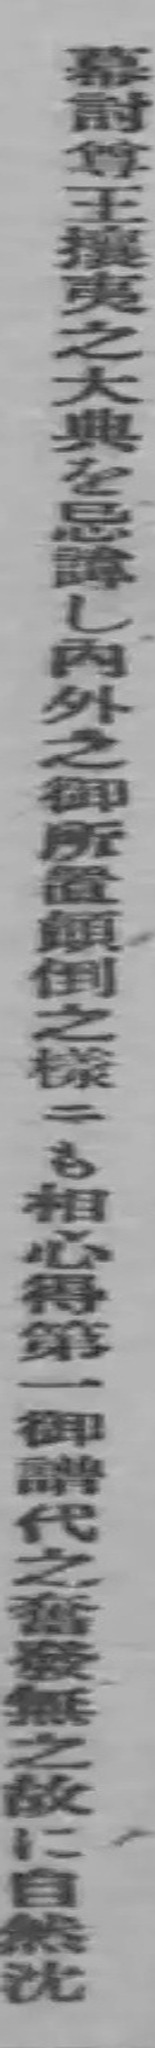幕討尊王攘夷之大典を忌憚し内外之御所置顛倒之様ニも相心得第一御譜代之奮発無之故に自然沈
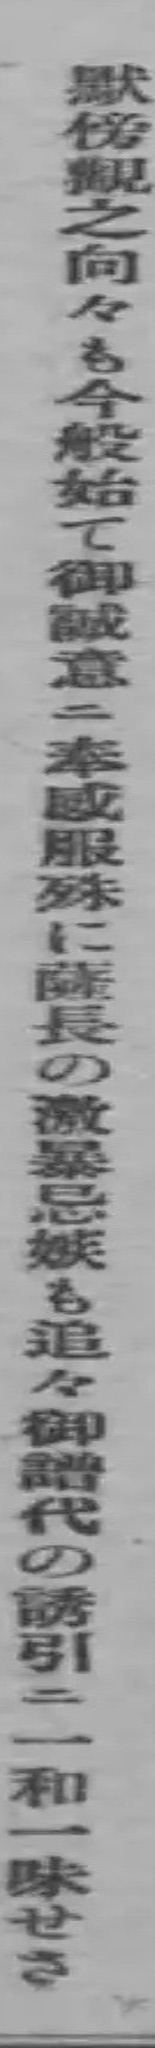黙傍観之向々も今般始て御誠意ニ奉感服殊に薩長の激暴忌嫉も追々御譜代の誘引ニ一和一味せさ
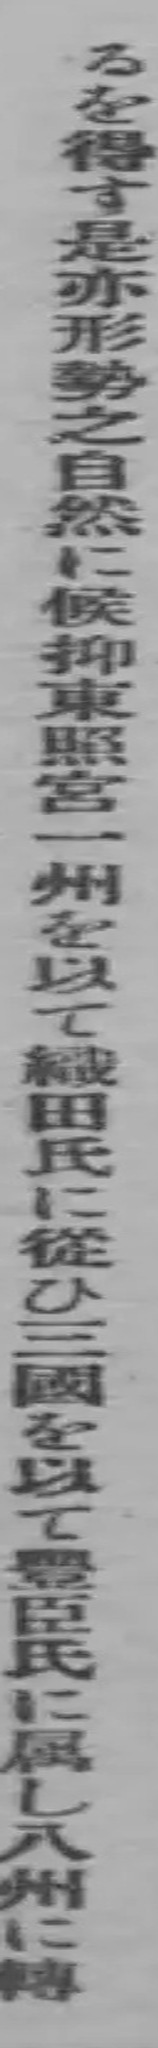るを得す是亦形勢之自然に候抑東照宮一州を以て織田氏に従ひ三国を以て豊臣氏に属し八州に転
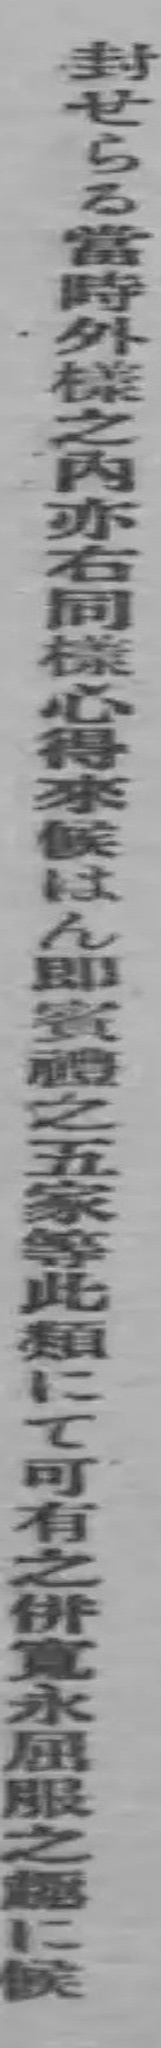封せらる当時外様之内亦右同様心得来候はん即賓礼之五家等比類にて可有之倂寛永屈服之趣に候
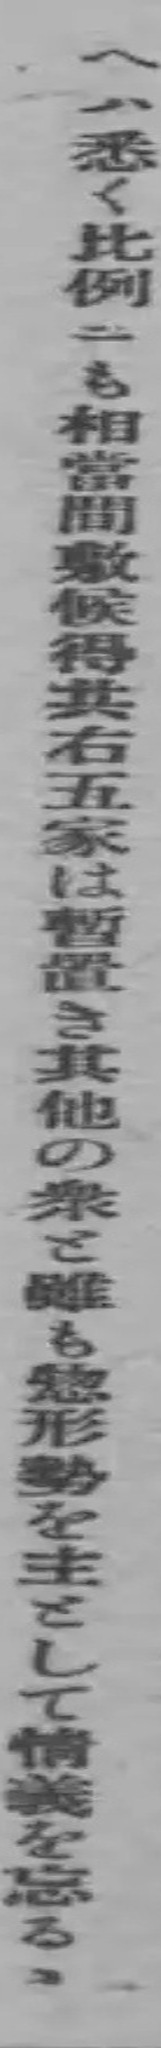へハ悉く比例ニも相当間敷候得共右五家は暫置き其他の衆と雖も惣形勢を主として情義を忘るゝ
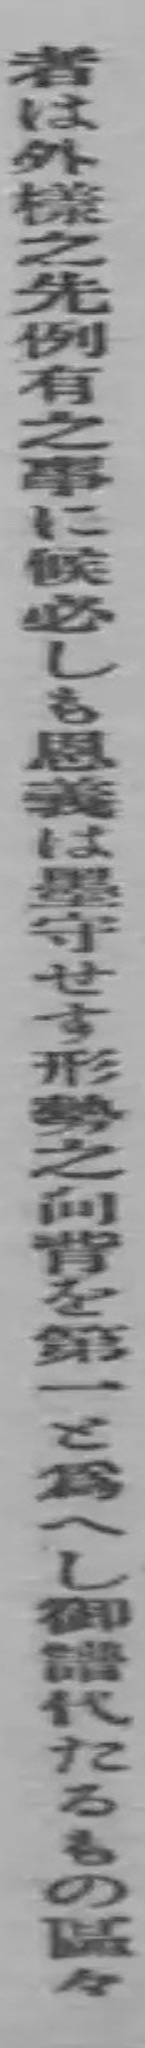者は外様之先例有之事に候必しも恩義は墨守せず形勢之向背を第一と為へし御譜代たるもの区々
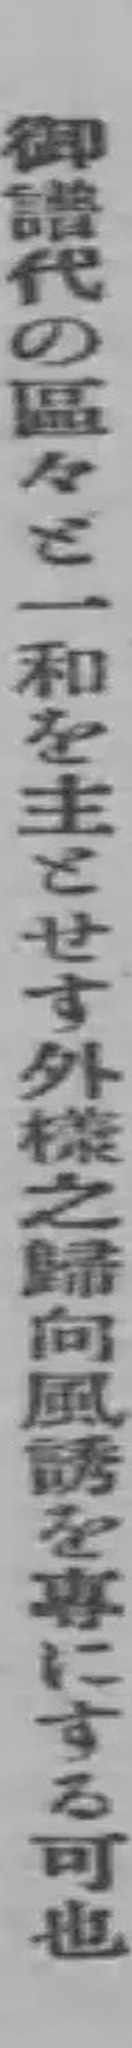御譜代の区々と一和を主とせす外様之帰向風誘を専にする可也
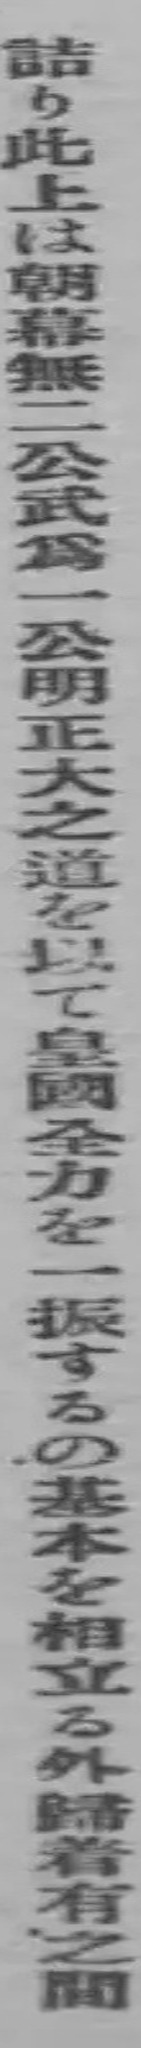詰り此上は朝幕無二公武為一公明正大之道を以て皇国全力を一振するの基本を相立る外帰着有之間
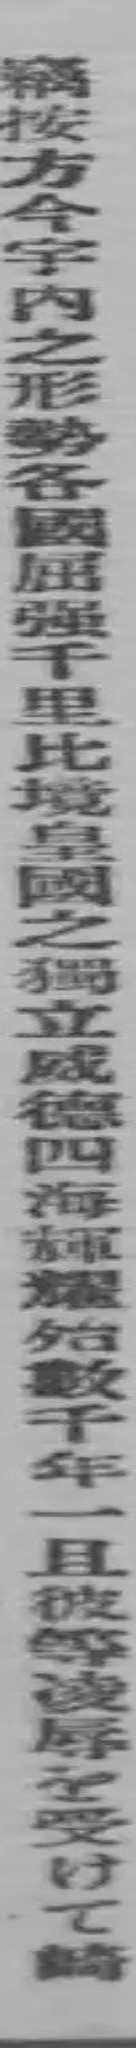竊按方今宇内之形勢各国屈強千里比境皇国之独立威徳四海輝耀殆数千年一且彼等凌辱を受けて崎
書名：豊橋市史談
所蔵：国立国会図書館 National Diet Library, JAPAN
